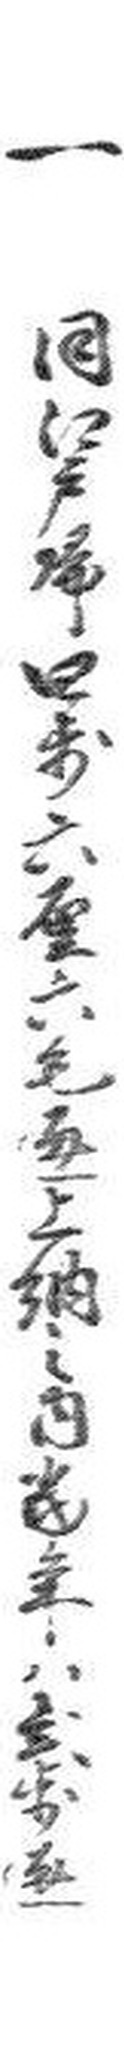一同江戸帰四歩六厘六毛通上納之内当年ハ弐歩通
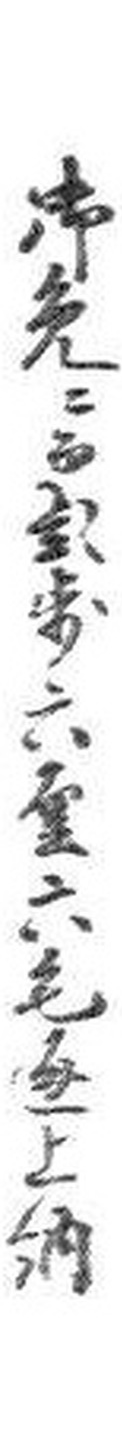御免ニ而弐歩六厘六毛通上納
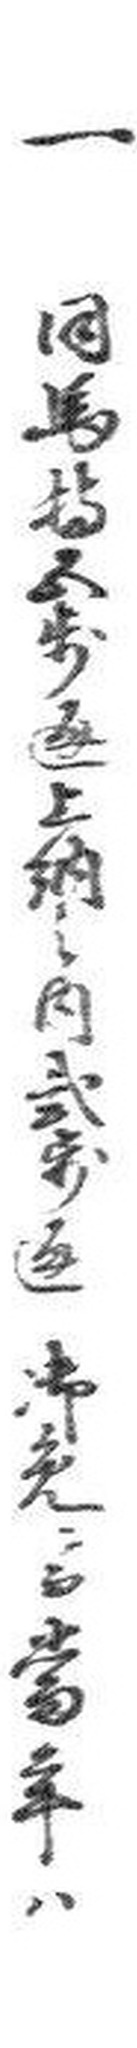一同馬持五歩通上納之内弐歩通御免ニ而当年ハ
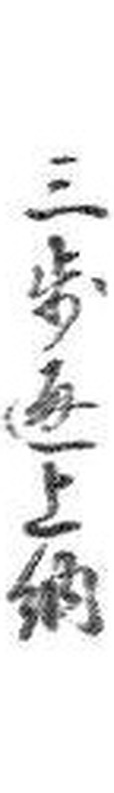三歩通上納
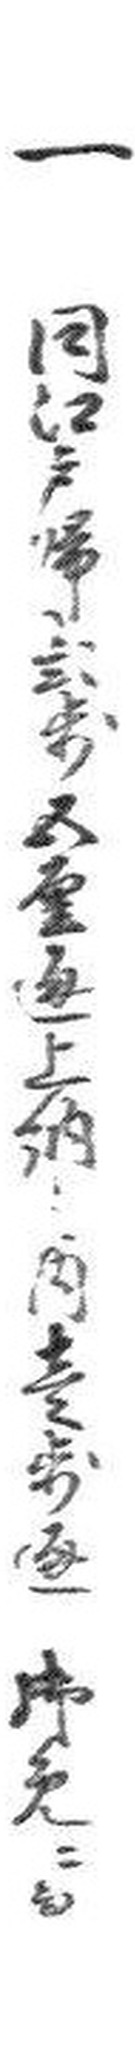一同江戸帰弐歩五厘通上納之内壱歩通御免ニ而
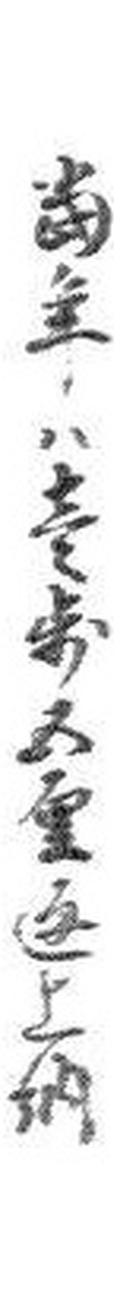当年ハ壱歩五厘通上納
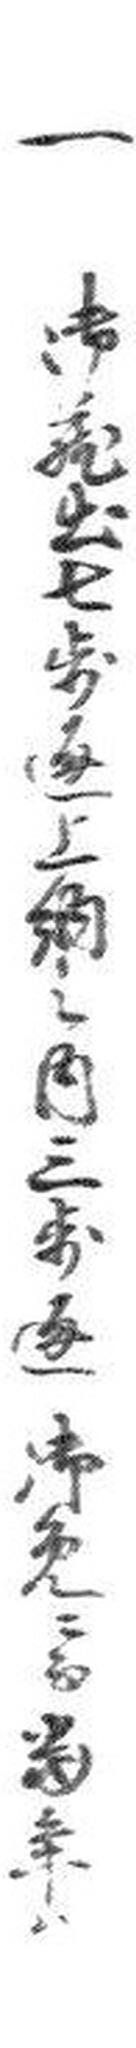一御蔵出七歩通上納之内三歩通御免ニ而当年ハ

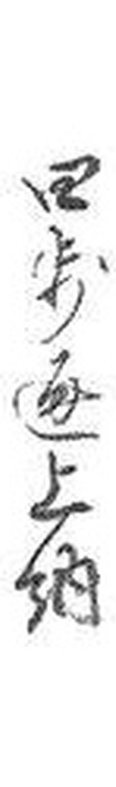四歩通上納
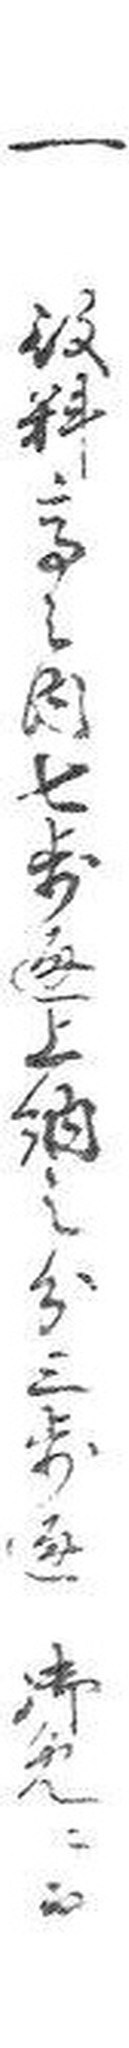一役料高之内七歩通上納之分三歩通御免ニ而
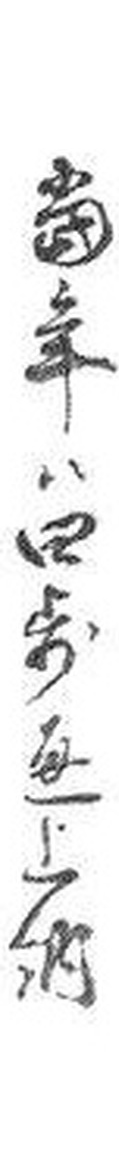当年ハ四歩通上納
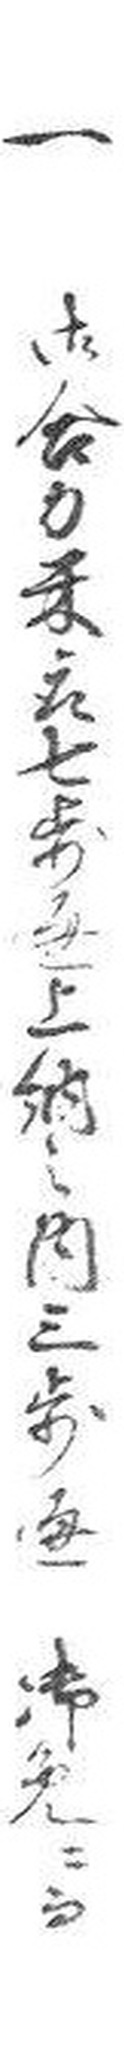一御合力米取七歩通上納之内三歩通御免ニ而
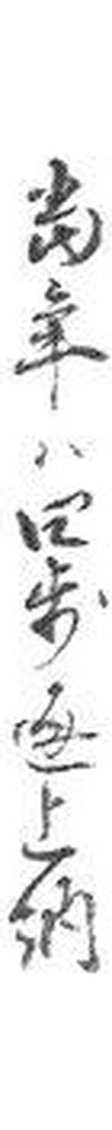当年ハ四歩通上納
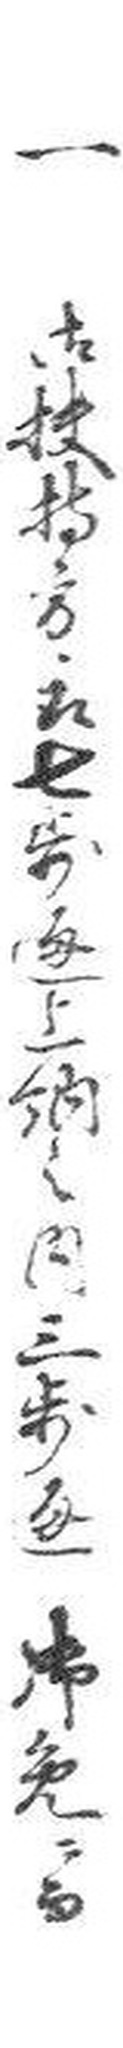一御扶持方取七歩通上納之内三歩通御免ニ而
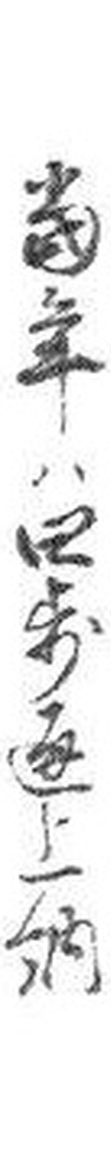当年ハ四歩通上納
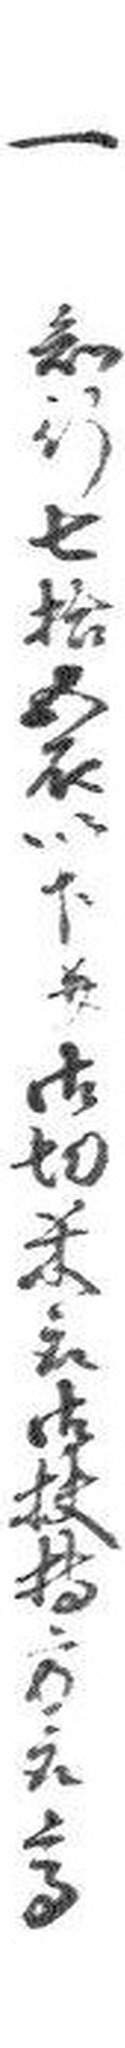一知行七拾五石以下并御切米取御扶持方取高
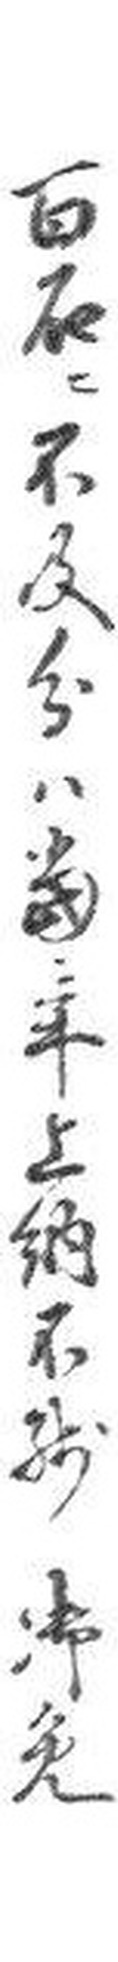百石ニ不及分ハ当年上納不残御免
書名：家譜 二十八 吉邦公 従宝永七年七月五日到正徳元年十二月
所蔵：福井県文書館 Fukui Prefectural Archives
